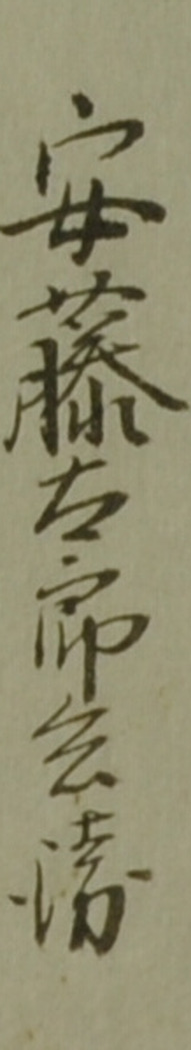安藤太郎兵衛
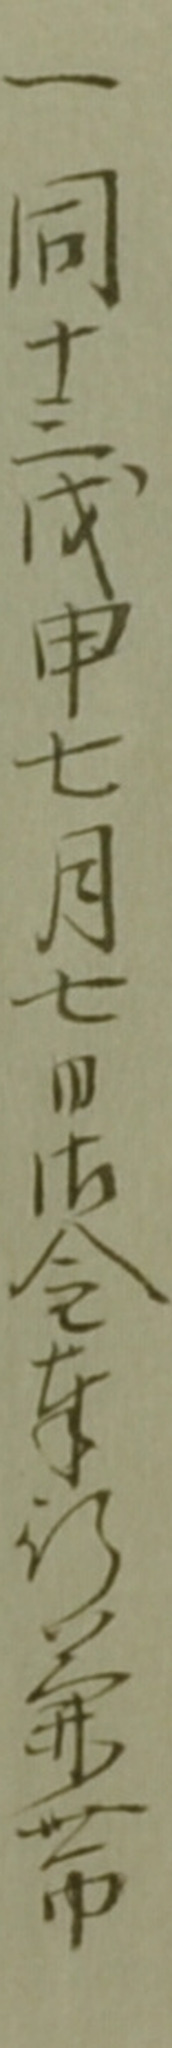一同十三戊申七月七日御金奉行兼帯
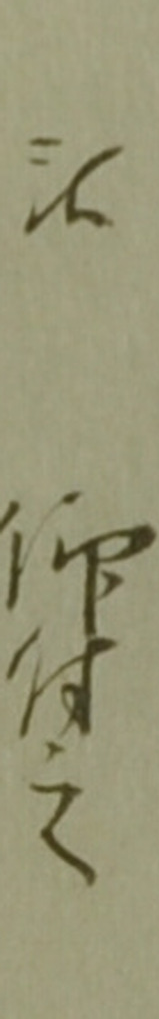被仰付之
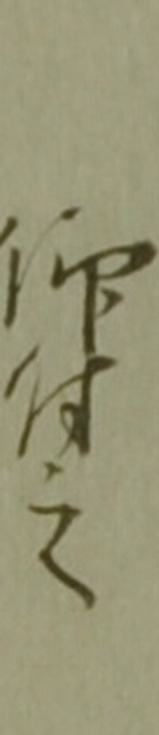仰付之
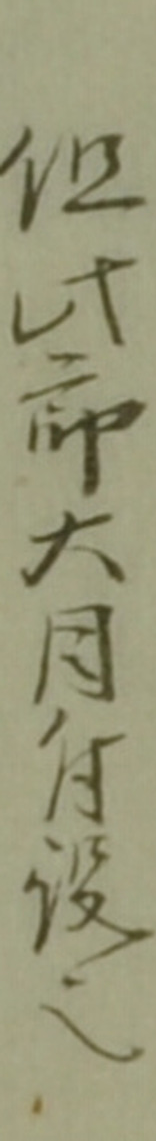但此節大目付役也
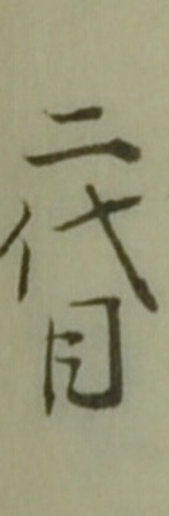二代目
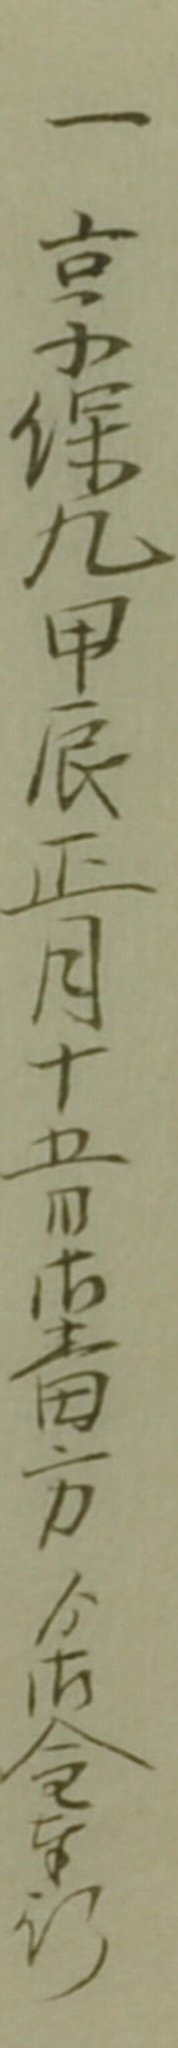一享保九甲辰正月十五日御番方ゟ御金奉行
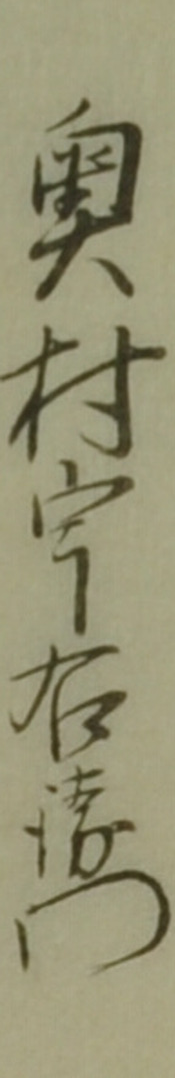奥村宇右衛門
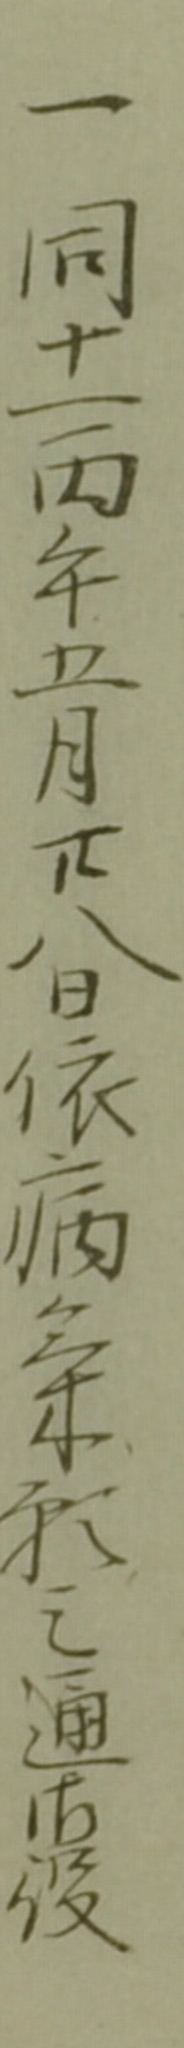一同十一丙午五月廿八日依病気願之通御役
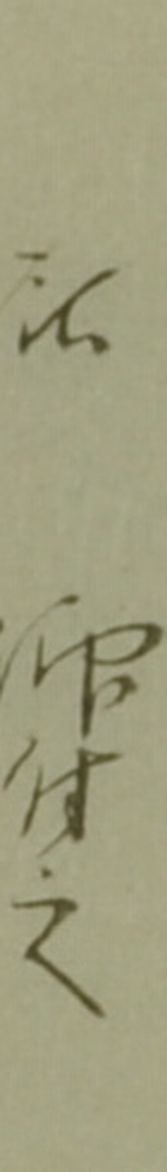被仰付之
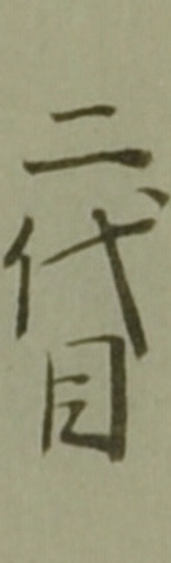二代目
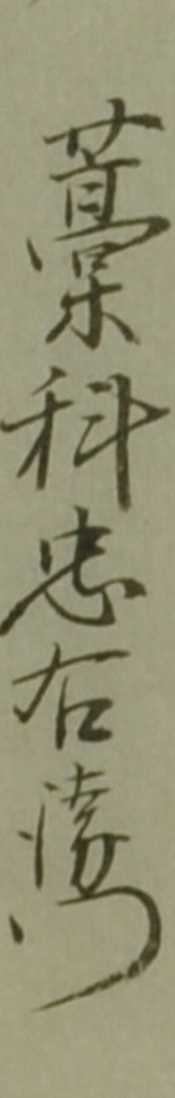藁科忠右衛門
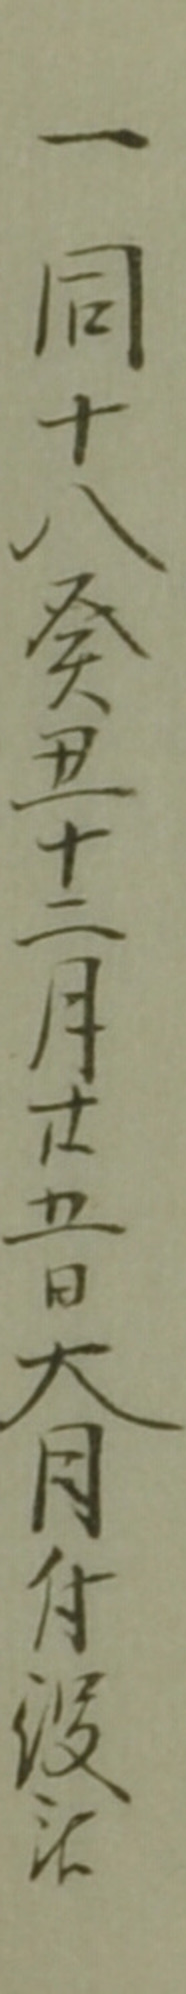一同十八癸丑十二月廿五日大目付役被
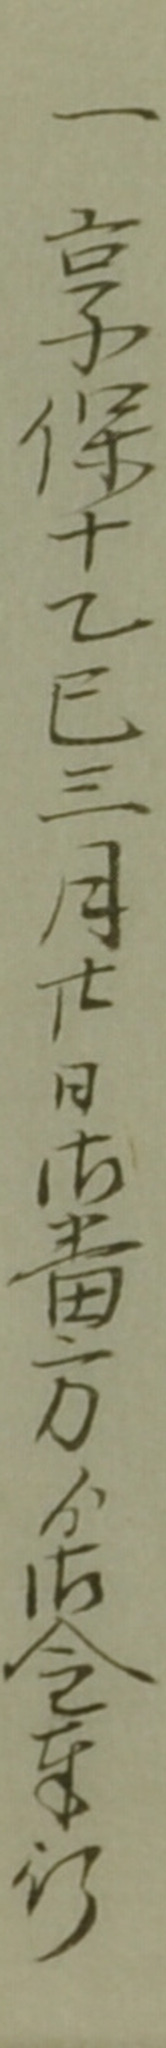一享保十乙巳三月廿日御番方ゟ御金奉行
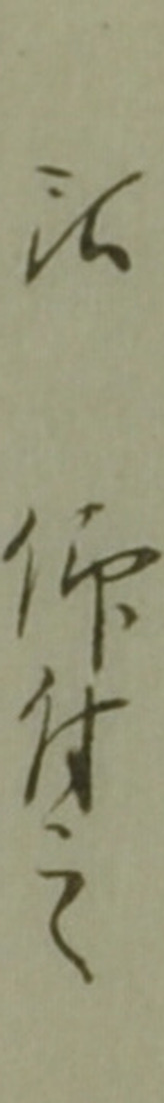被仰付之
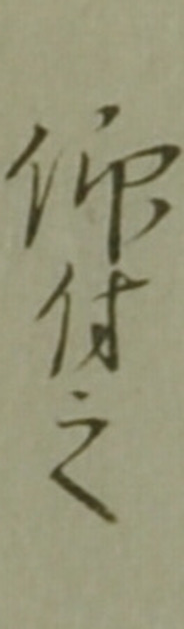仰付之
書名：諸御役代々録（七）
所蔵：伊那市立高遠町図書館・合同会社AMANE
